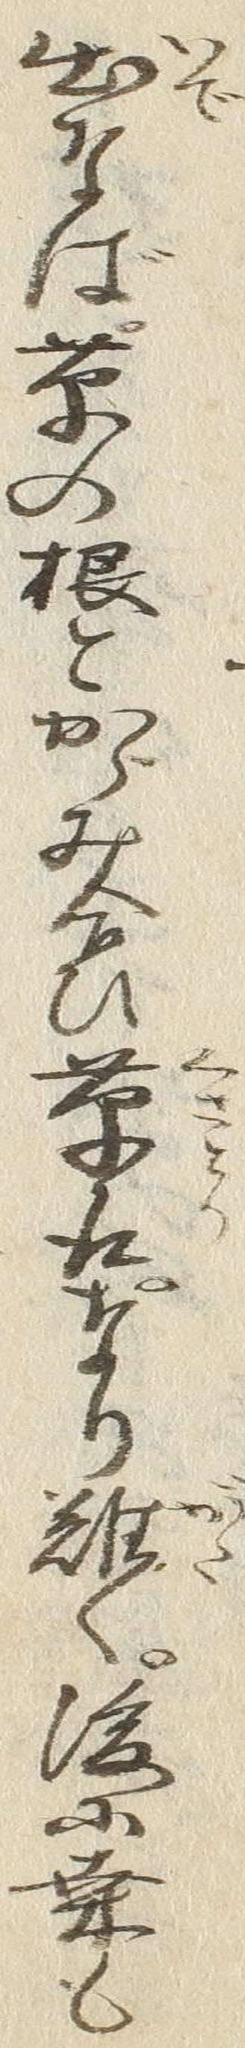出なば。草の根とからみ合ひ草取。なり難く。後尓桑も
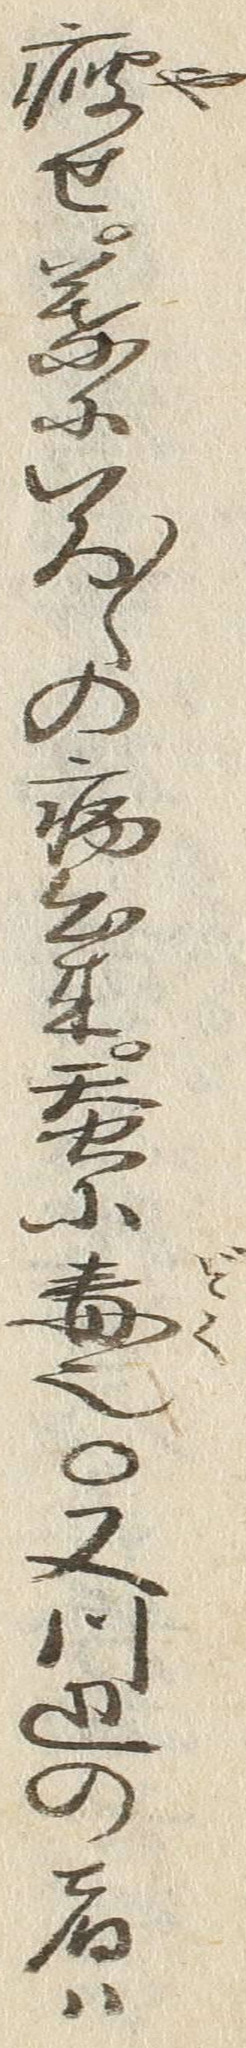痩せ。葉尓いろ〳〵の病出来。蚕尓毒也〇又川辺の者は
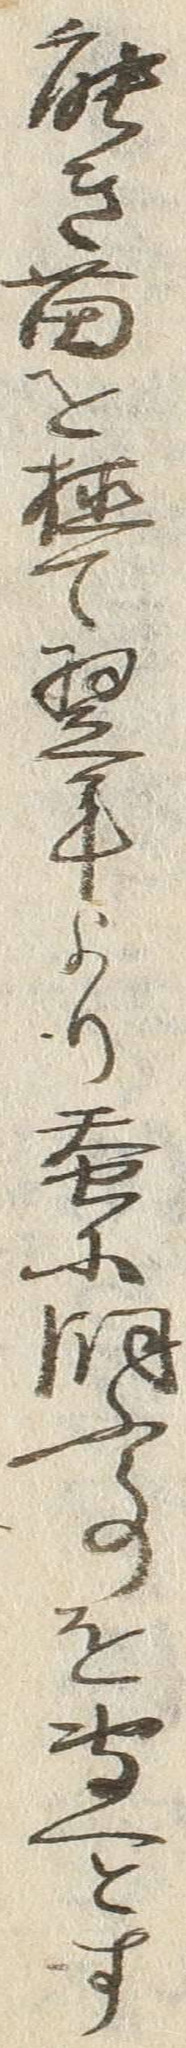能き苗を植て翌年より蚕尓飼ふ事を第一とす
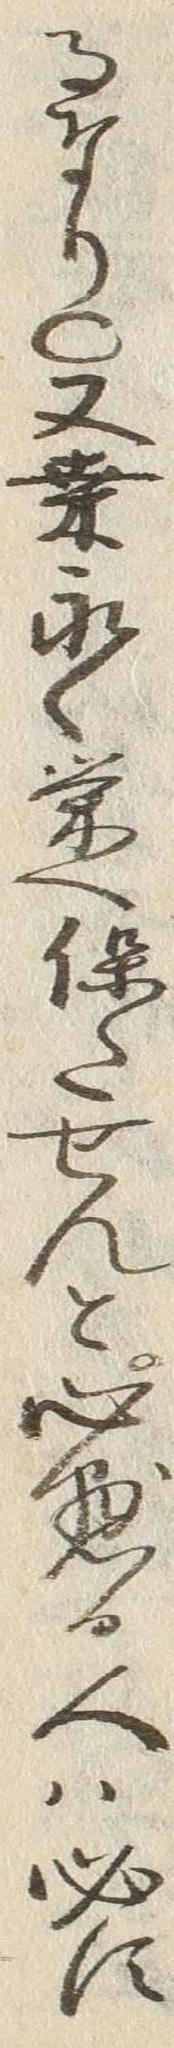るなり〇又桑永く栄へ保たせんと。心懸る人は必須
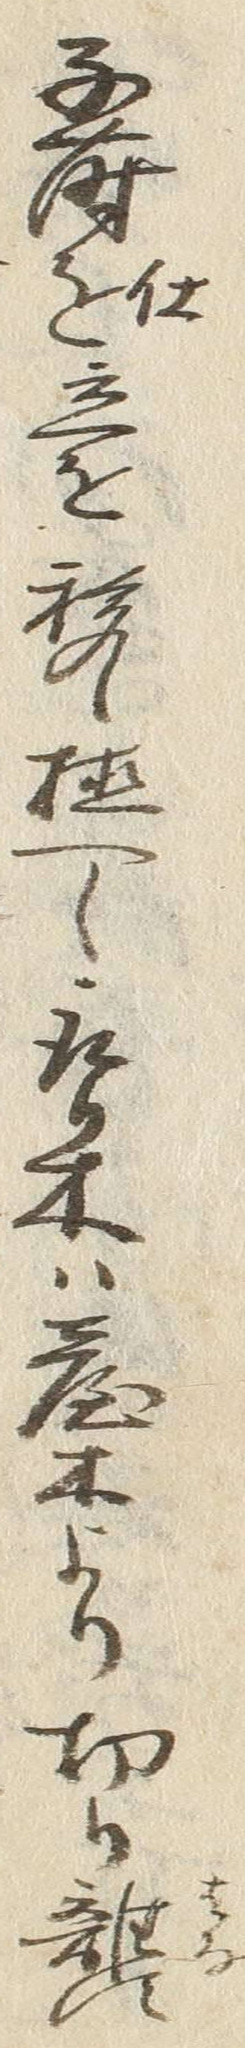子蒔仕立を移し植へし取り木は臺木より切り離須
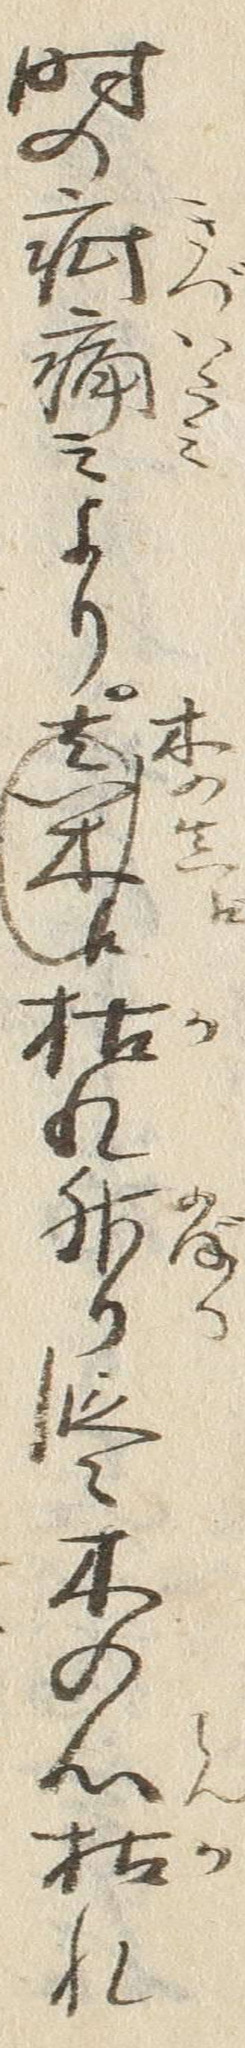時の疵痛みより。木の真江枯れ昇り段々木の心枯れ
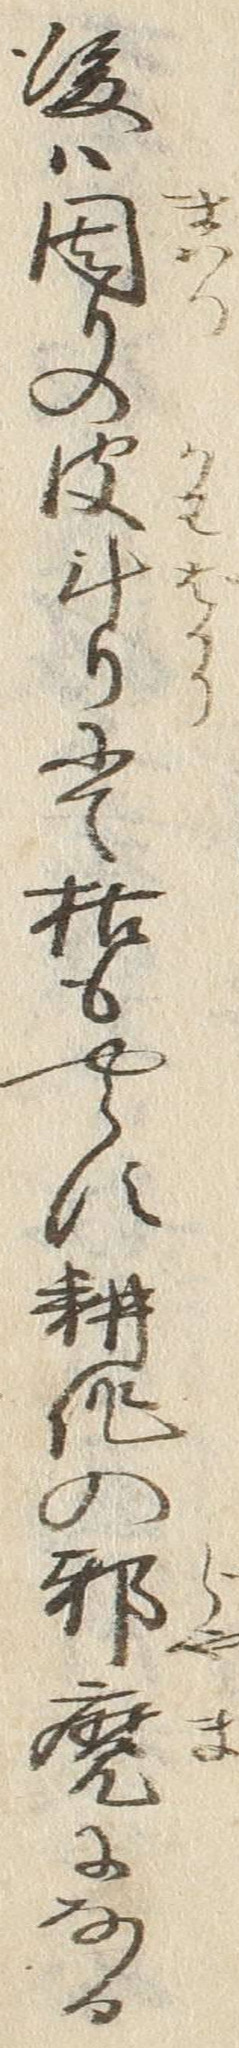後は周りの皮斗り尓て枯もやら須耕作の邪魔尓なる
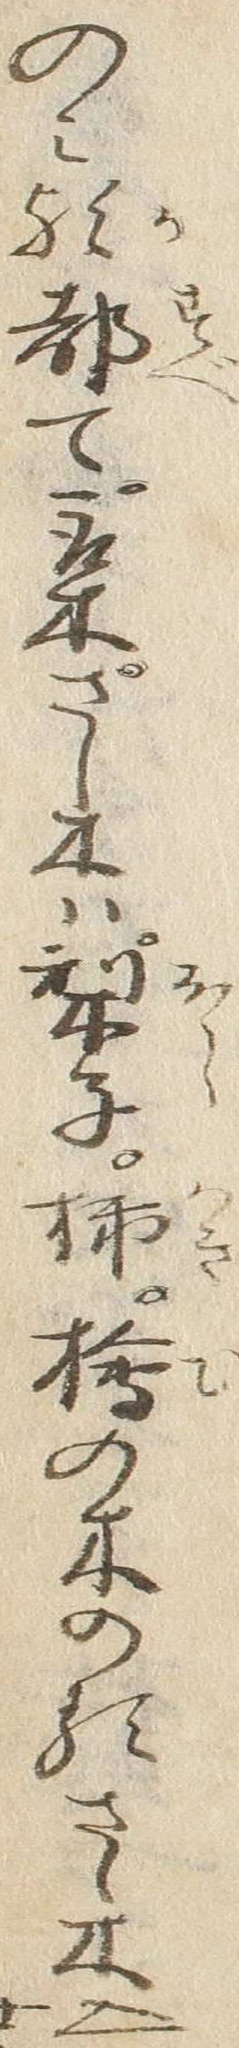のみ歟都て。取木。さし木は。梨子。柿。檜の木の類さし木△

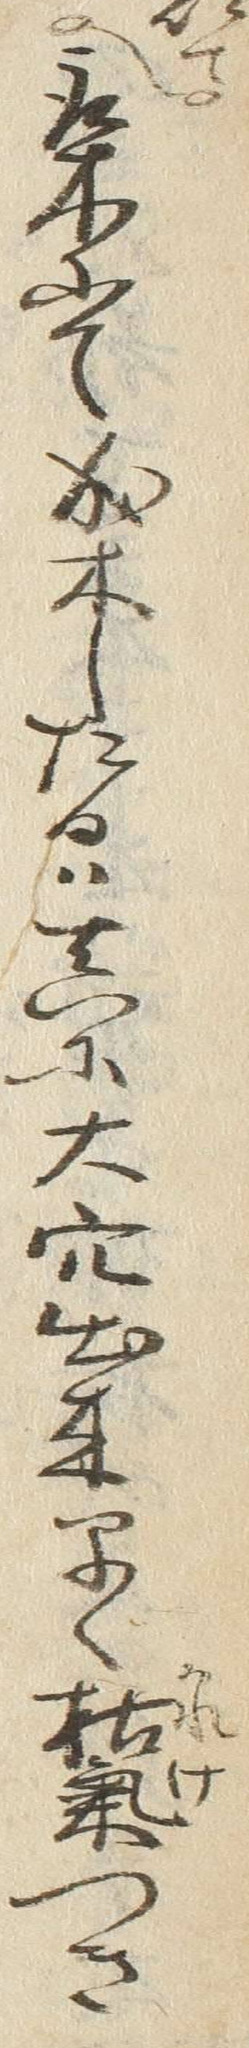△て取木尓て成木したるは真尓大穴出來早く枯氣つき
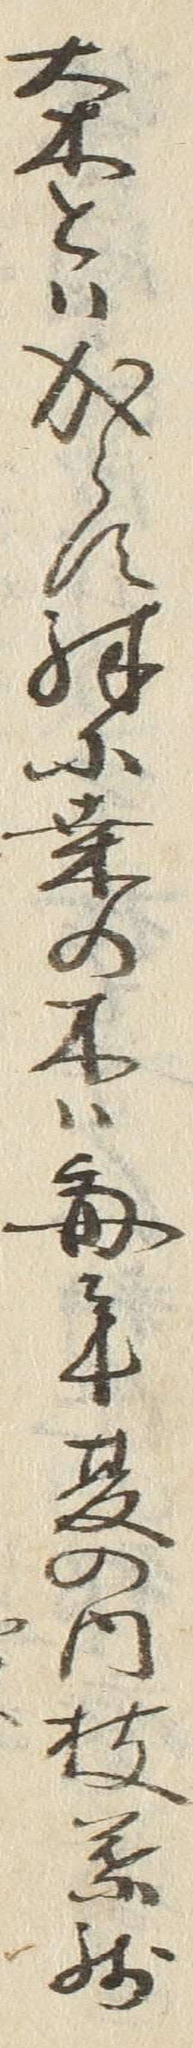大木とは成ら須殊尓桑の木は毎年夏の内枝葉残
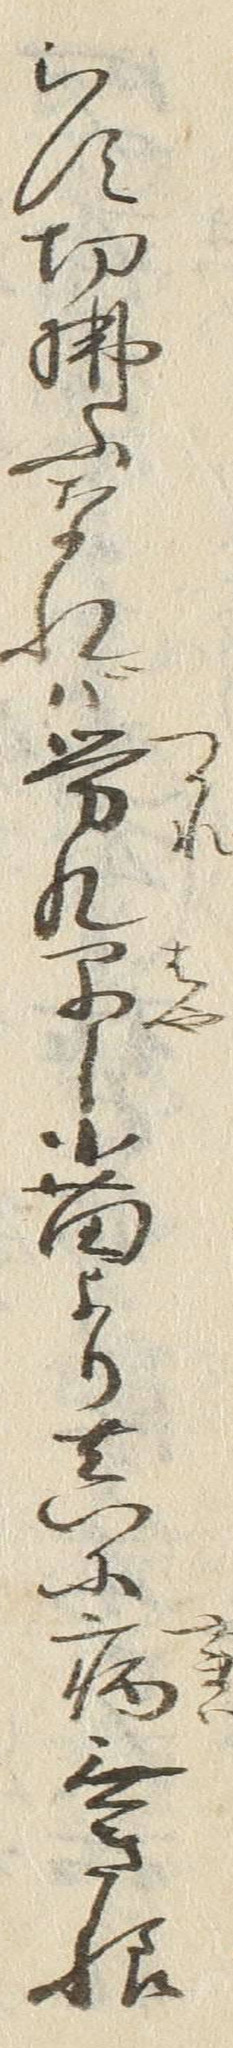ら須切拂ふなれば労れ早し小苗より真尓病無き様
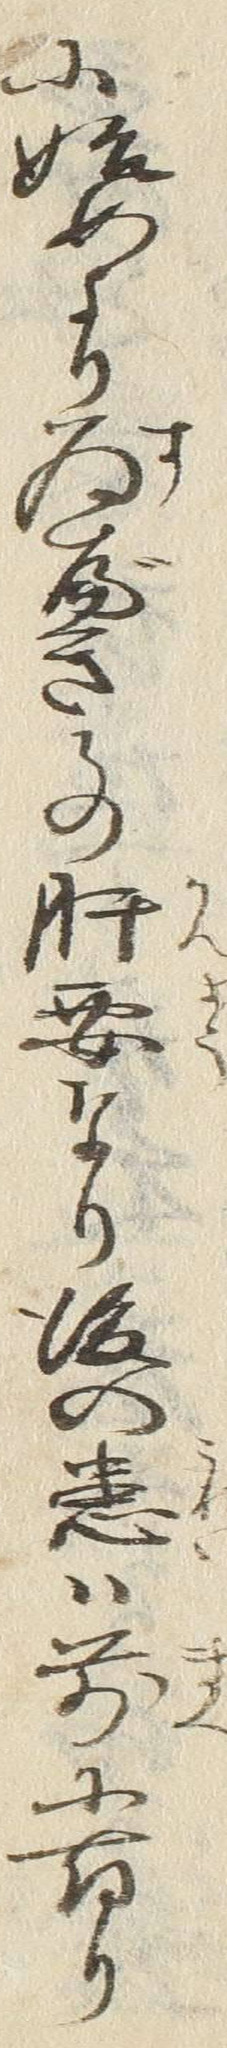尓始めより為べき事肝要なり後の患は前尓有り
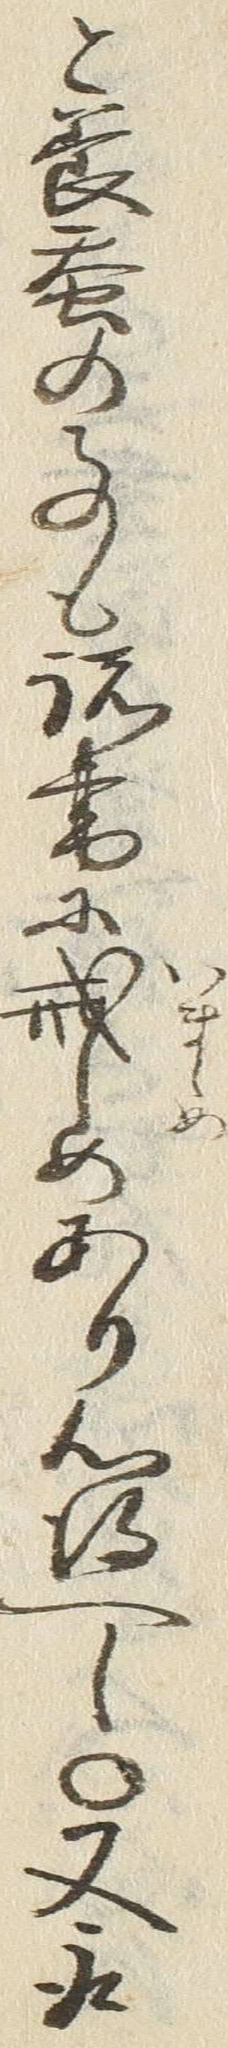と養蚕の事も諸書尓戒めあり心得へし〇又取
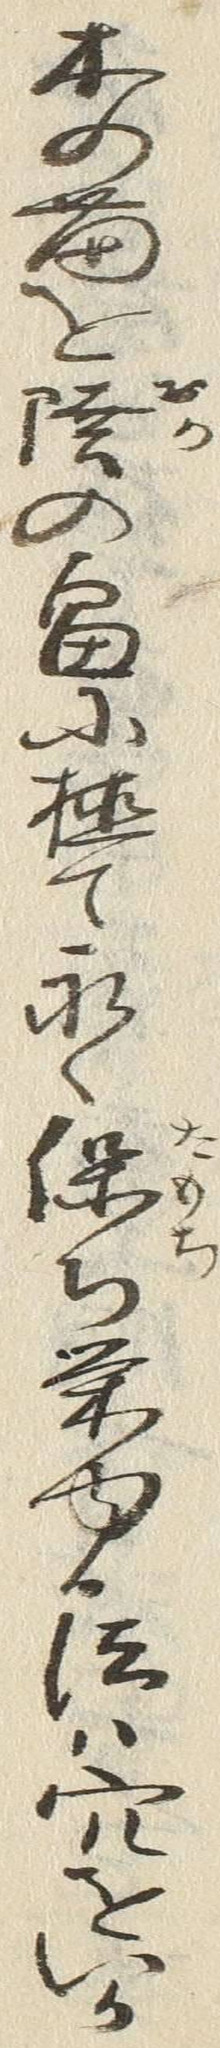木の苗を陸の畠尓植て永く保ち栄ゆる法は穴をいか
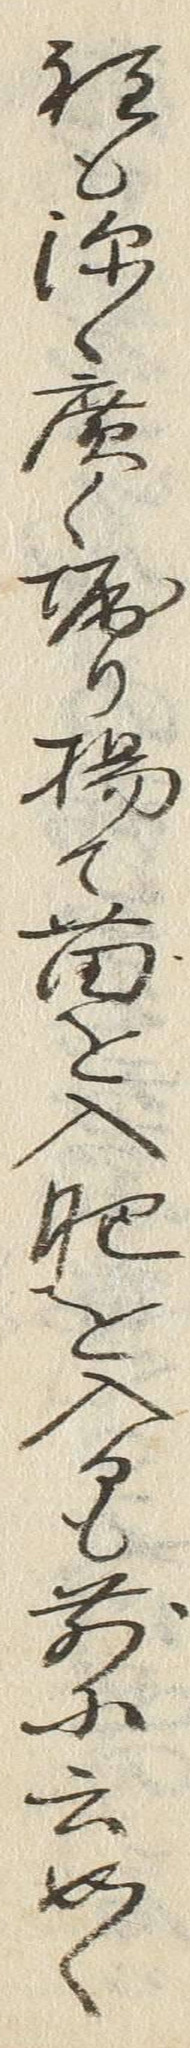程も深く廣く堀り揚て苗を入肥を入るも前尓云如く
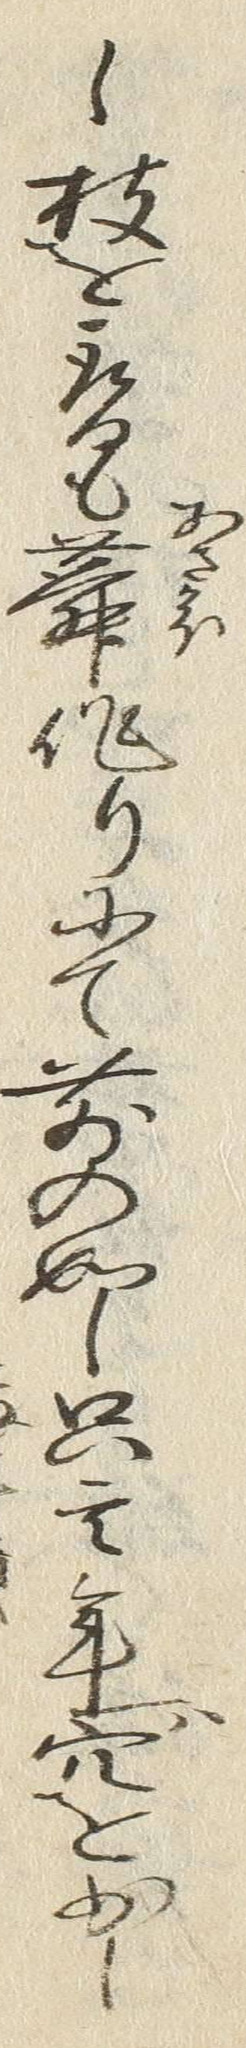し枝を取るも蕣作り尓て前の如し只其年は穴を少し
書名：養蠶實驗録後編
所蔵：東京大学農学生命科学図書館 国文学研究資料館
